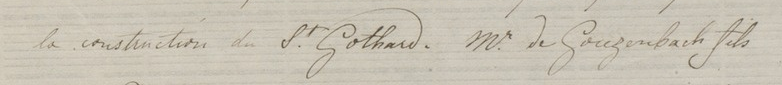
la construction du St Gothard. Mrde Gonzenbach fils
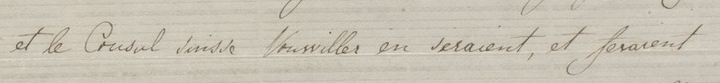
et le Conseil suisse Vonwiller en seraient, et feraient
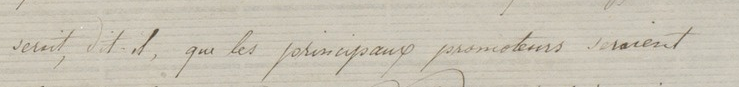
serait, dit-il, que les principaux promoteurs seraient
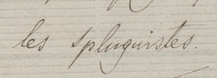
les Spluguistes.
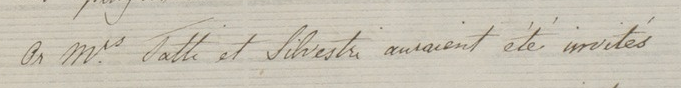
Or MrsTatti et Silvestri auraient été invités
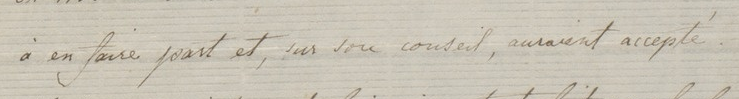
à en faire part et, sur son conseil, auraient accepté.
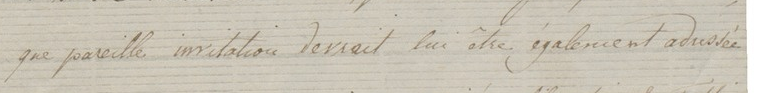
que pareille invitation devrait lui être également adressée
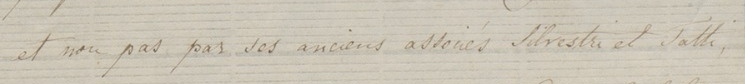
et non pas par ses anciens associés Silvestri et Tatti,
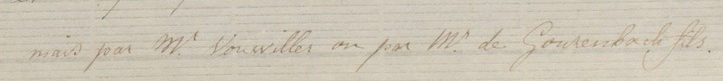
mais par MrVonwiller ou par Mrde Gonzenbach fils.
